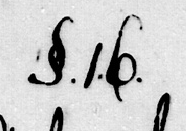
§. 16.
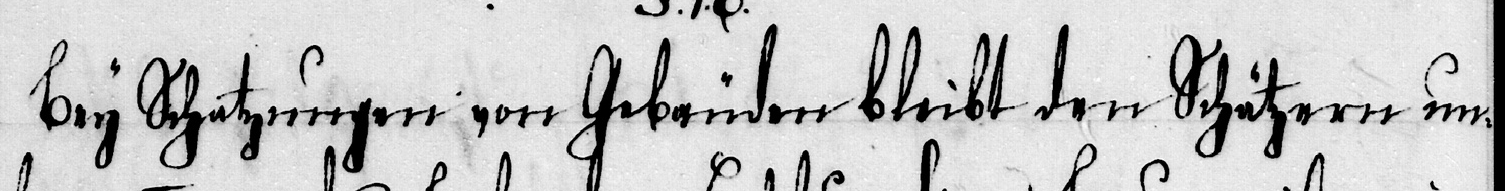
Bey Schatzungen von Gebäuden bleibt den Schätzern un¬
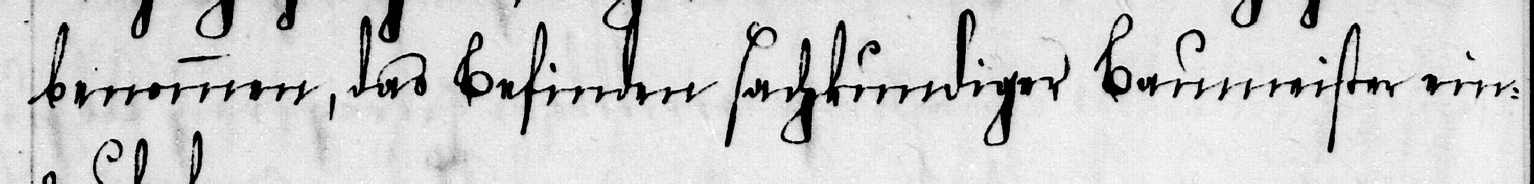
benommen, das Befinden sachkundiger Baumeister ein¬
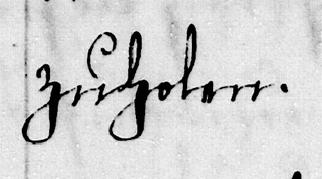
zuholen.
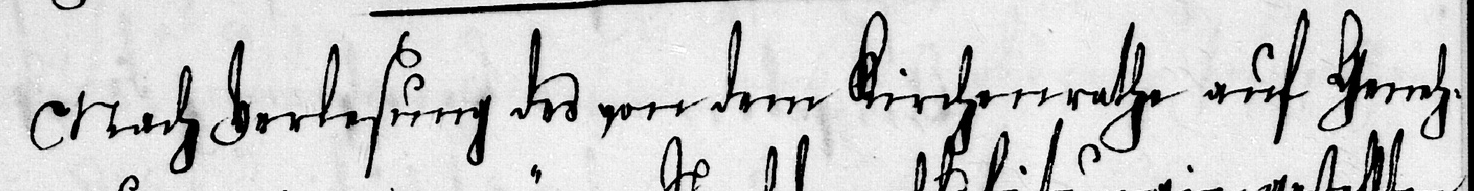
Nach Verlesung des von dem Kirchenrathe auf Geneh¬
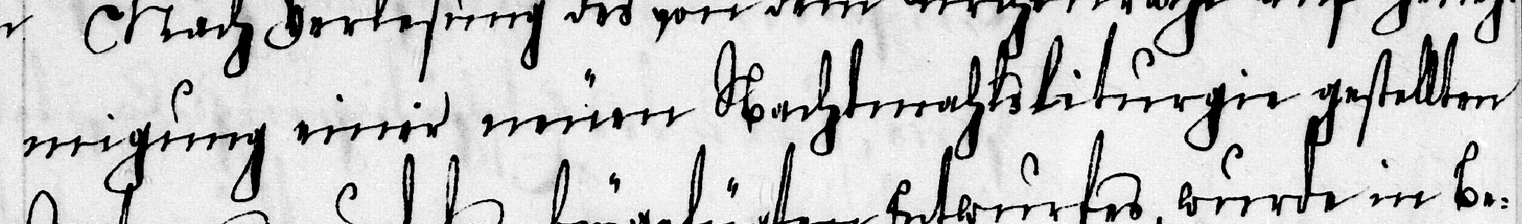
migung einer neuen Nachtmahlsliturgie gestellten
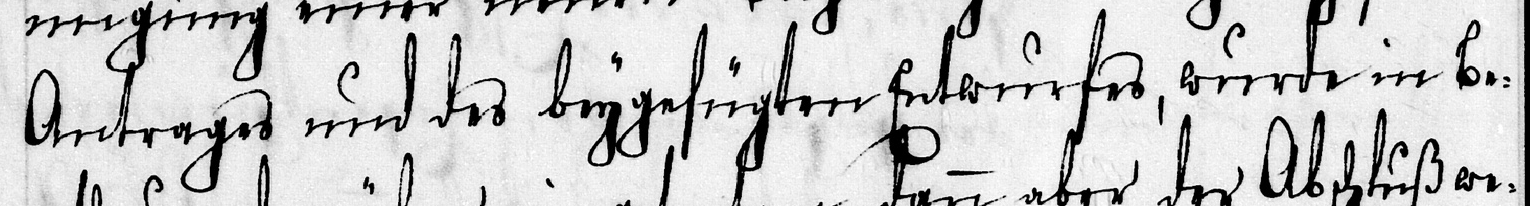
Antrages und des beygefügten Entwurfes, wurde in Be¬
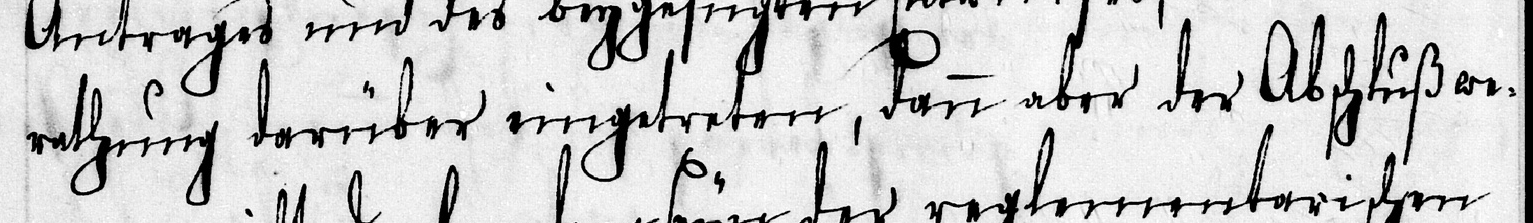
rathung darüber eingetreten, dann aber der Abschluß we¬
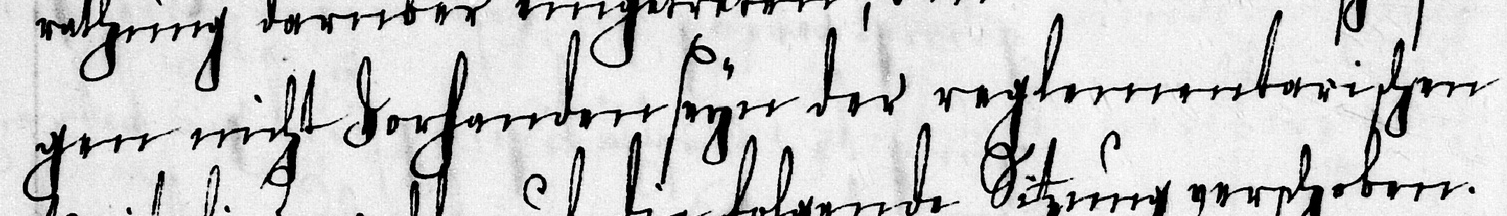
gen nicht Vorhandenseyn der reglementarischen
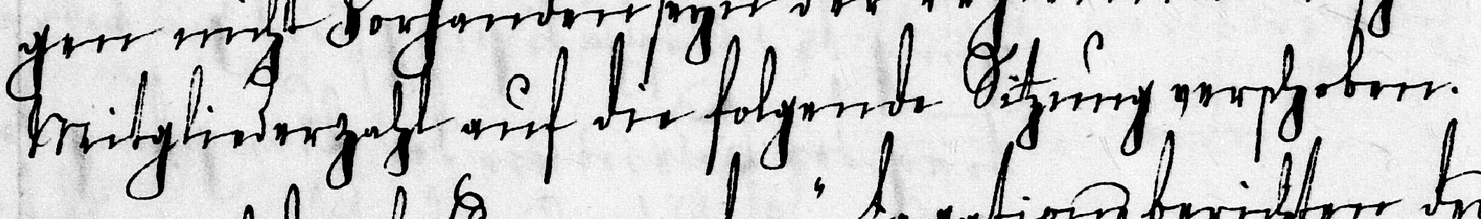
Mitgliederzahl auf die folgende Sitzung verschoben.
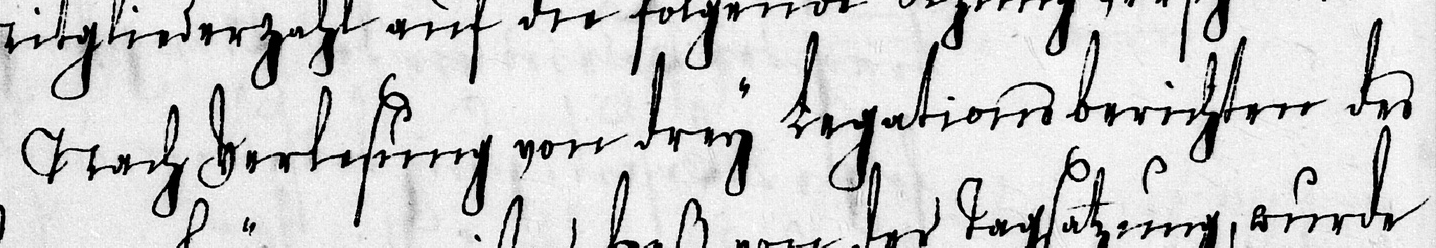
Nach Verlesung von drey Legationsberichten des
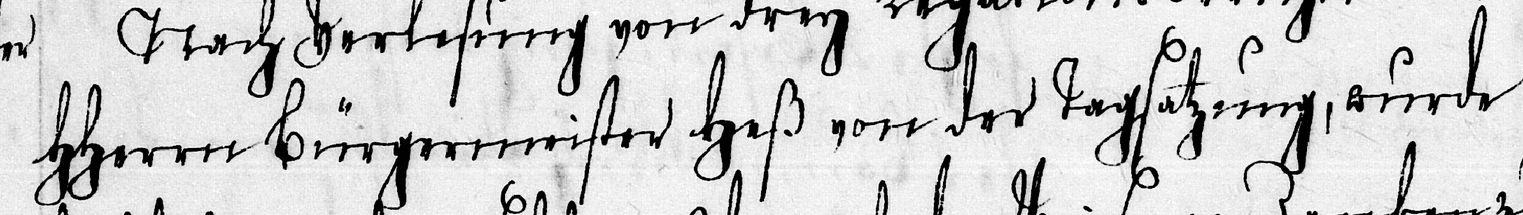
HHerrn Bürgermeisters Heß von der Tagsatzung, wurde
